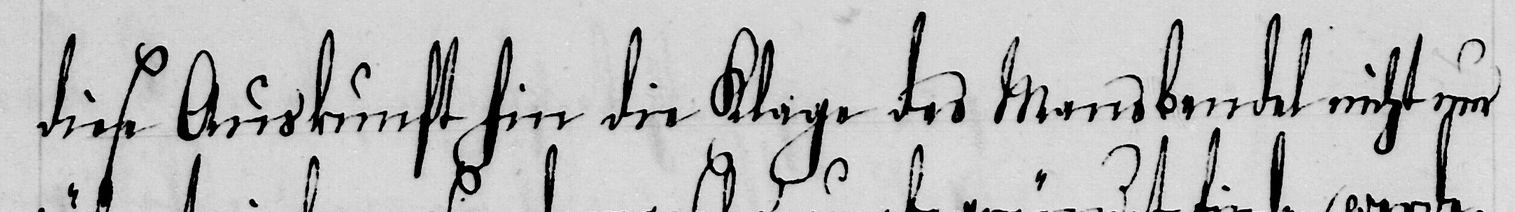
diese Auskunft hin die Klage des Mansbendel nicht
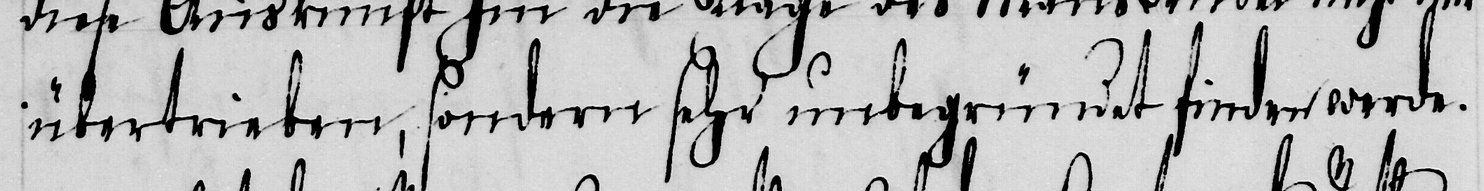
übertrieben, sondern sehr unbegründet finden werde.
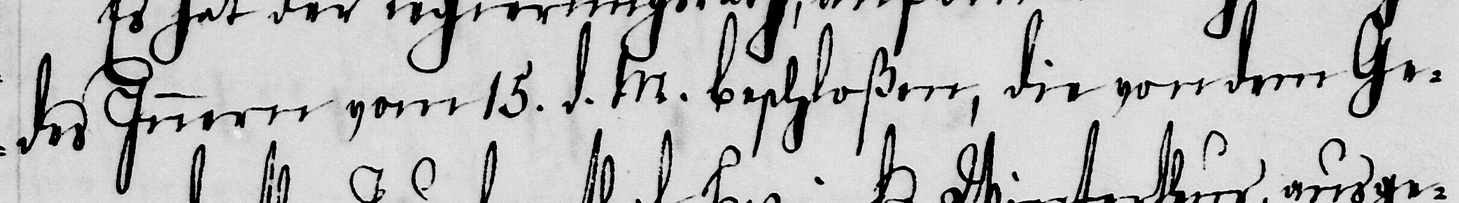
des Innern vom 15. d. M. beschloßen, die von dem Ge¬
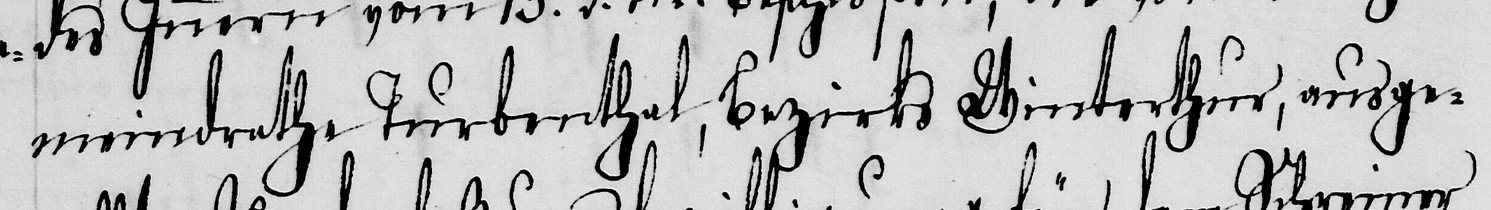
meindrathe Turbenthal, Bezirks Winterthur, ausge¬
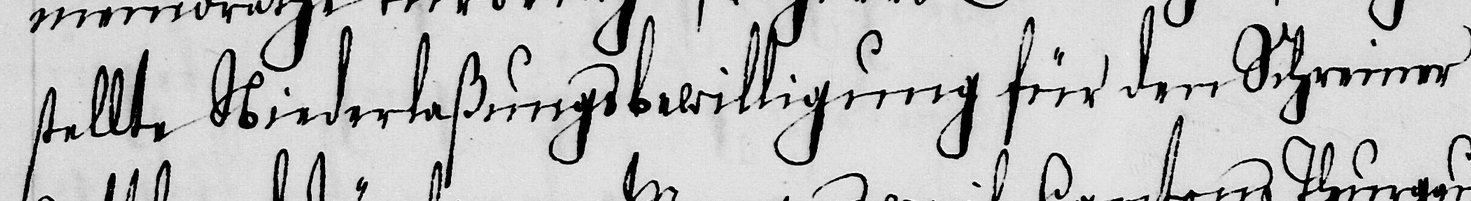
stellte Niederlaßungsbewilligung für den Schreiner
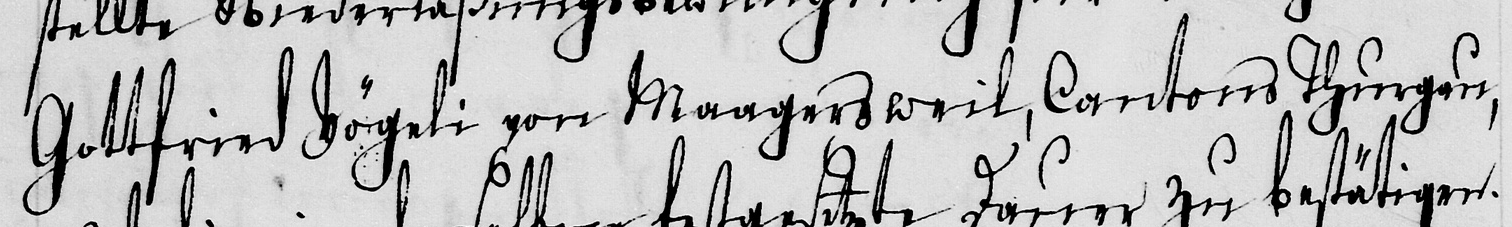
Gottfried Vögeli von Maagersweil, Cantons Thurgau,
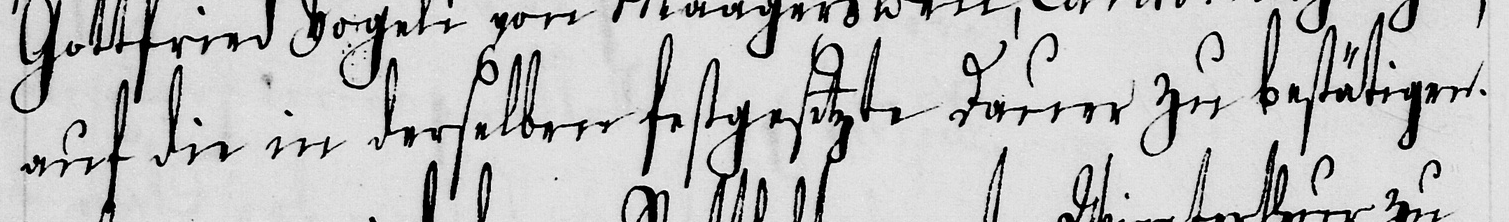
auf die in derselben festgesetzte Dauer zu bestätigen.
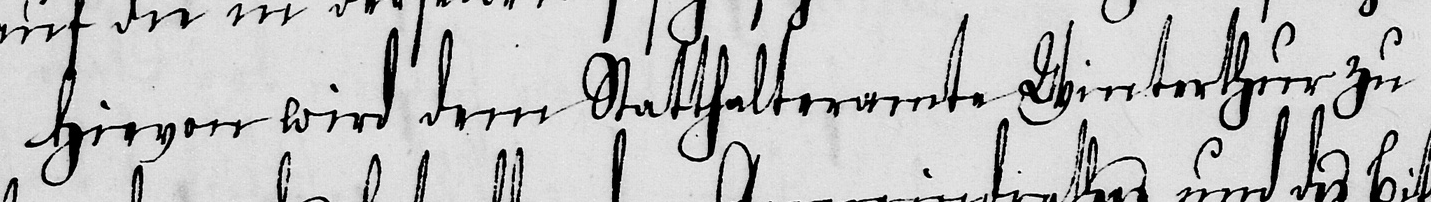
Hievon wird dem Statthalteramte Winterthur zu
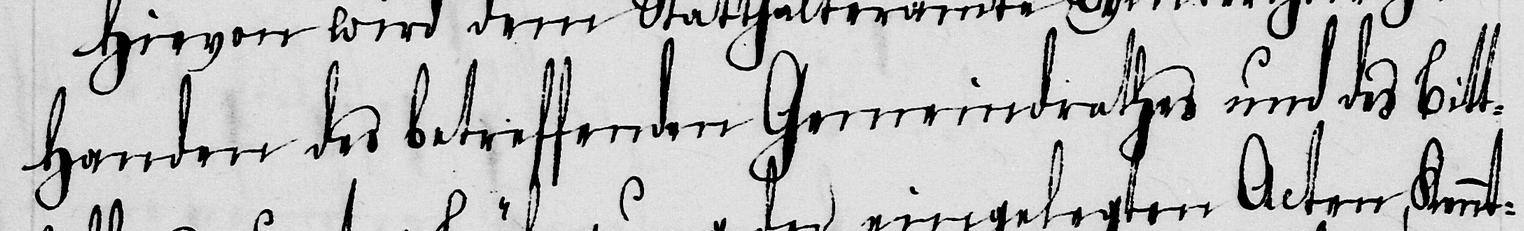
Handen des betreffenden Gemeindrathes und des Bit¬
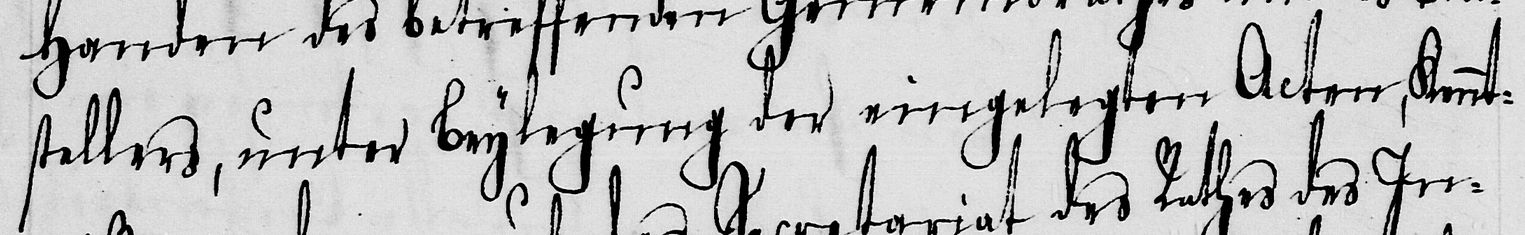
stellers, unter Beylegung der eingelegten Acten, Kenn¬
